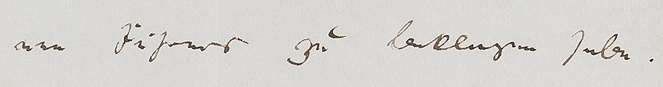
nen Führers zu beklagen habe.
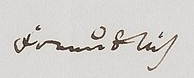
Freundlich
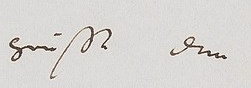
grüßt den
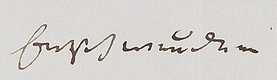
Entschwundnen
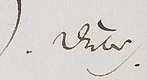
Dubs.
